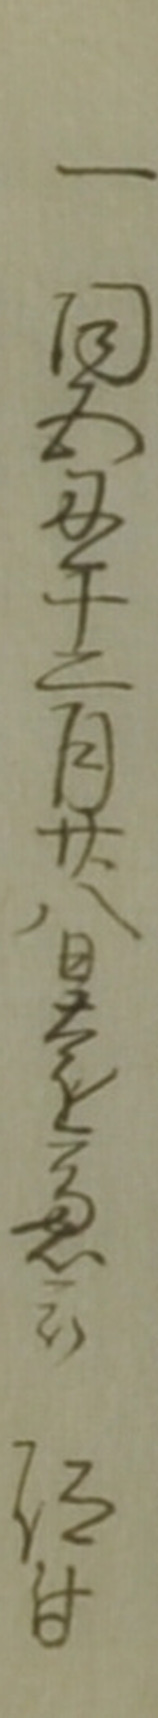一同五丑十二月廿八日遠慮被仰付
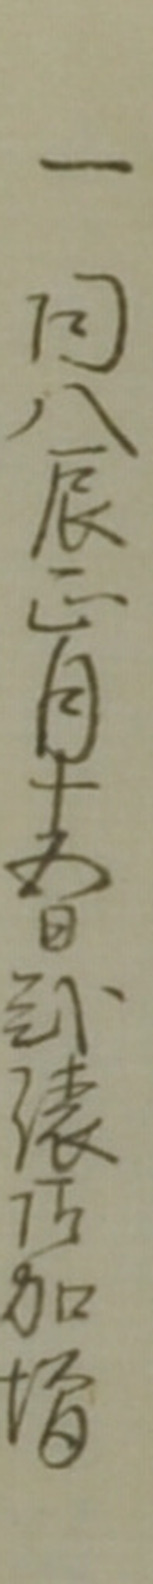一同八辰正月十五日弐俵御加増
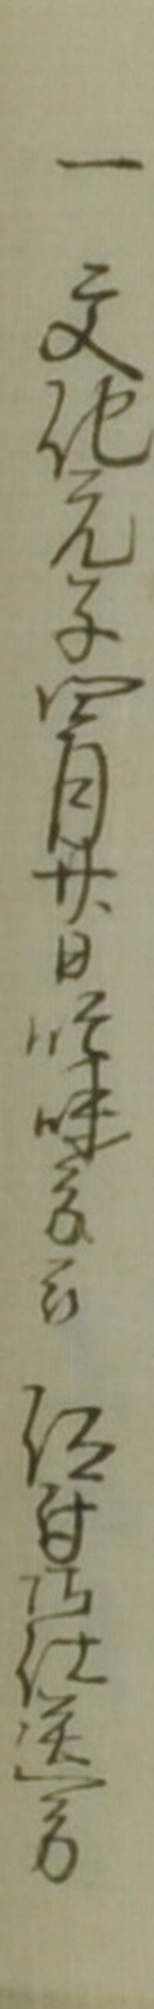一文化元子四月廿日吟味方被仰付御仕送方
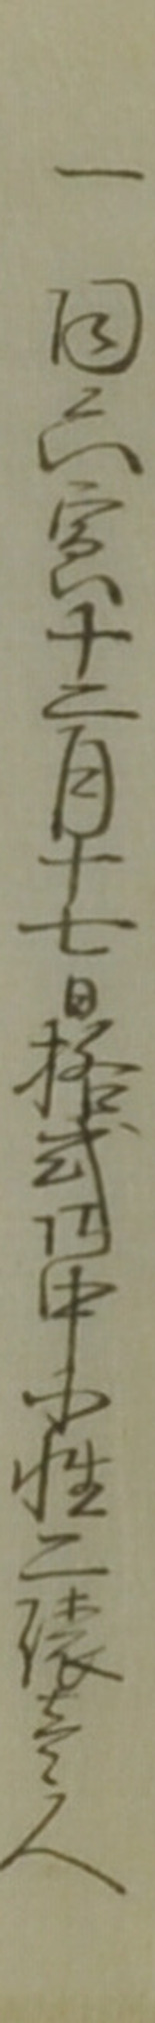一同六寅十二月十七日格式御中小性二俵壱人
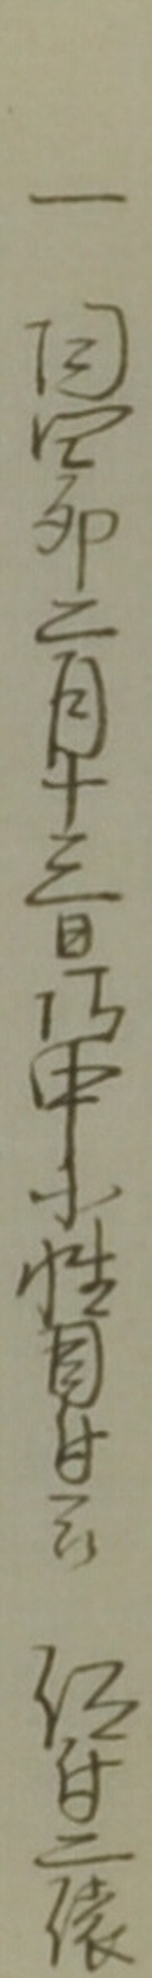一同四卯二月十三日御中小性目付被仰付二俵
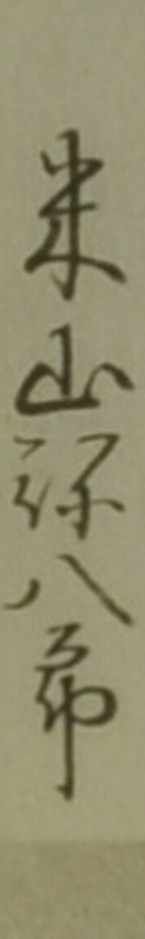米山弥八郎

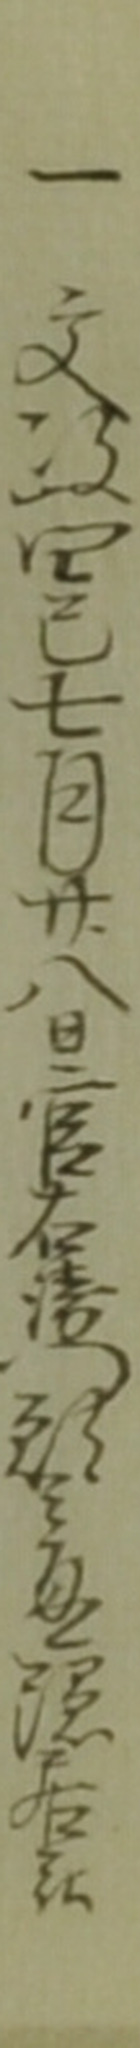一文政四巳七月廿八日官右衛門願之通隠居被
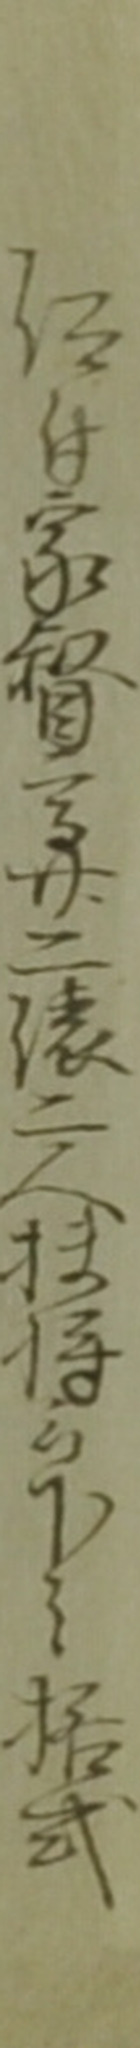仰付家督高廿二俵二人扶持被下之格式
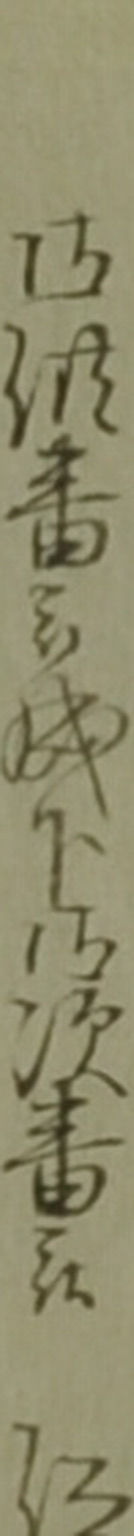御供番被成下御次番被仰付
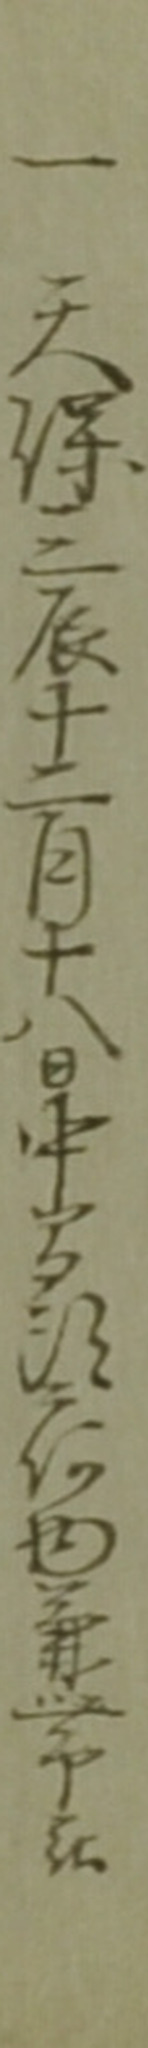一天保三辰十二月十八日中間願荷物兼帯被
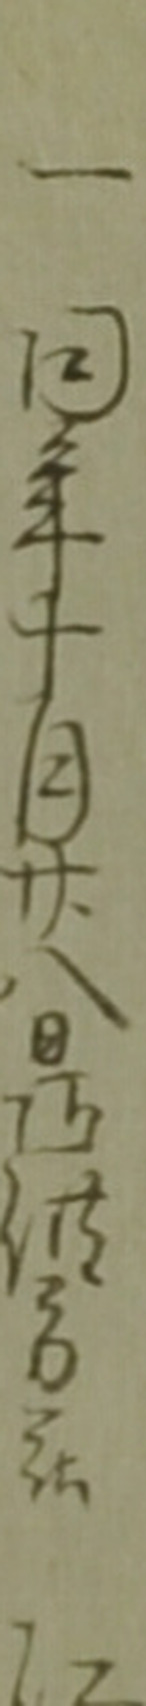一同年十月廿八日御供方被仰付
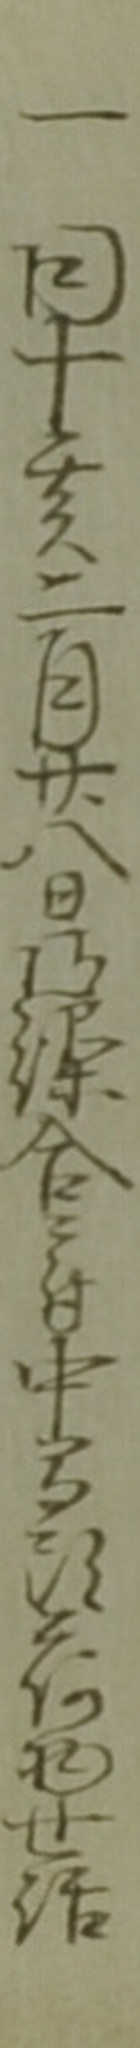一同十亥二月廿八日御繰合ニ付中間頭荷物世話
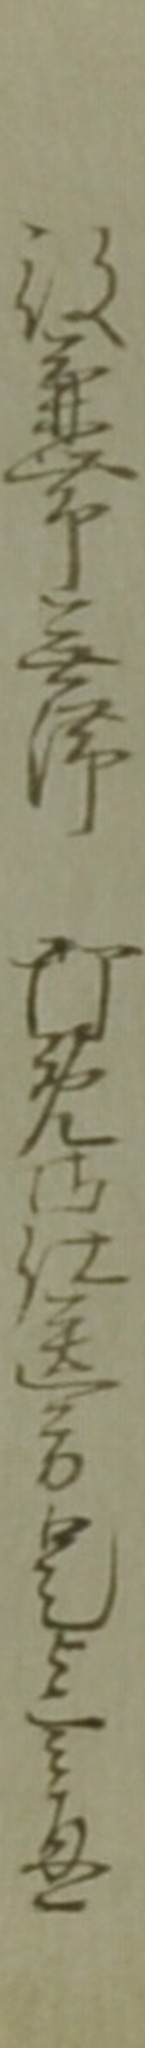役兼帯無滞御免御仕送方是迄之通
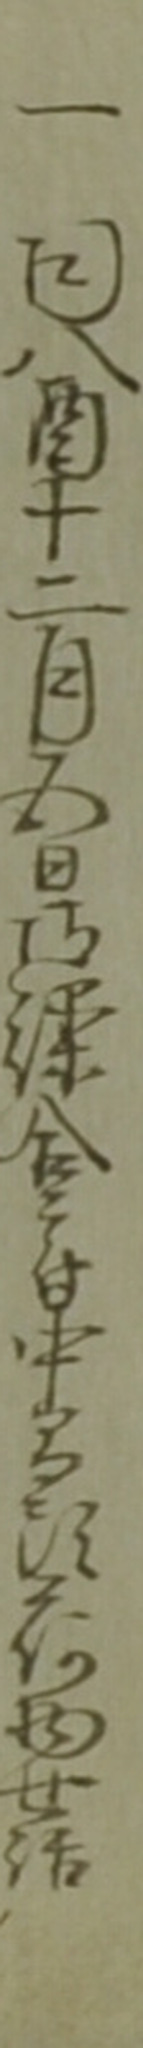一同八酉十二月五日御繰合ニ付中間願荷物世話
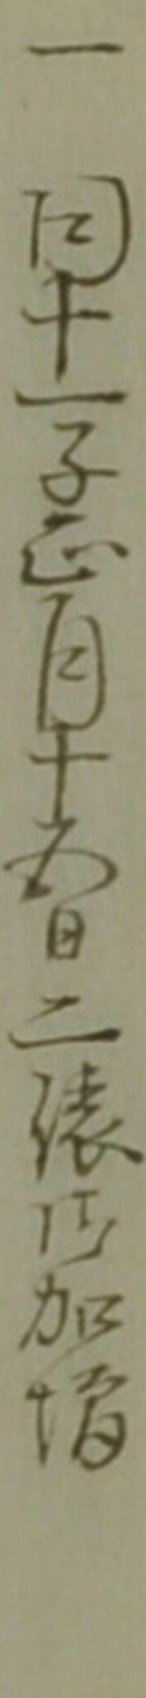一同十一子正月十五日二俵御加増
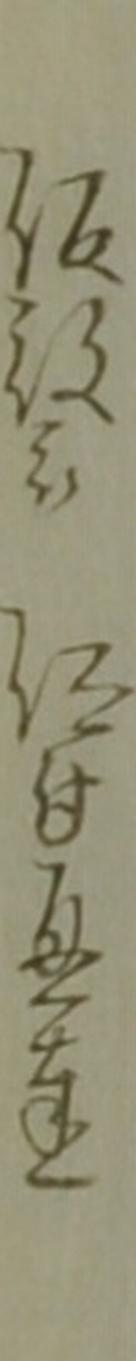仮役被仰付通達
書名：無足諸士勤仕録（二）
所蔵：伊那市立高遠町図書館・合同会社AMANE
